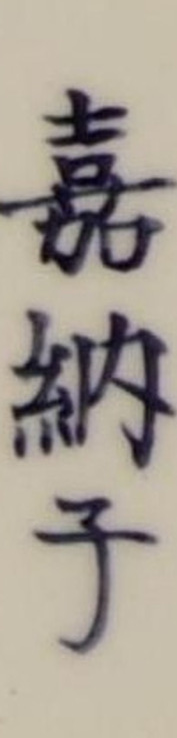嘉納子
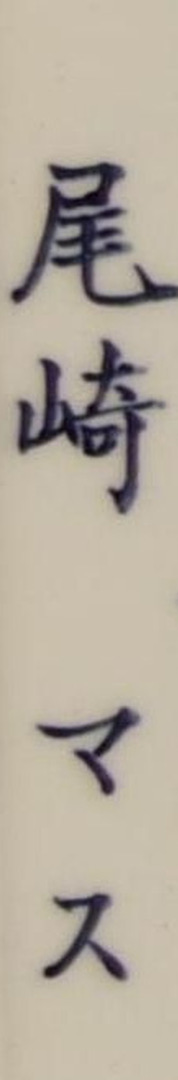尾崎マス

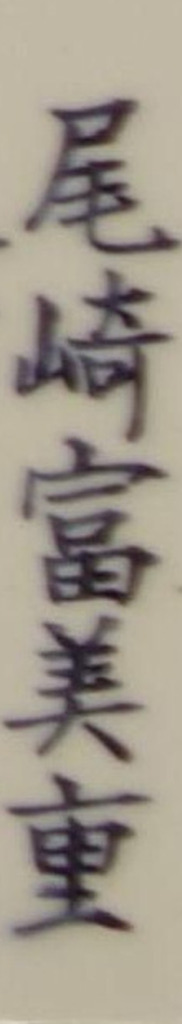尾崎富美重
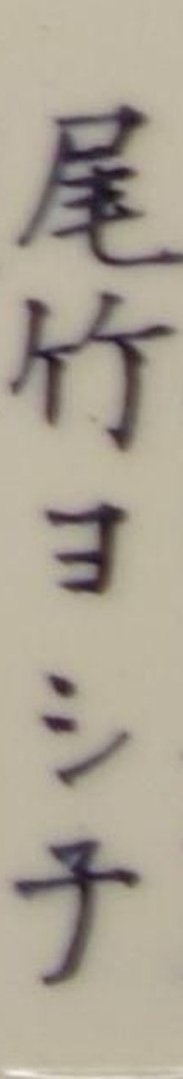尾竹ヨシ子
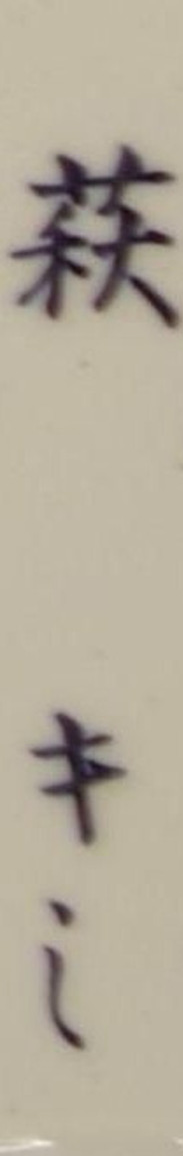萩キミ
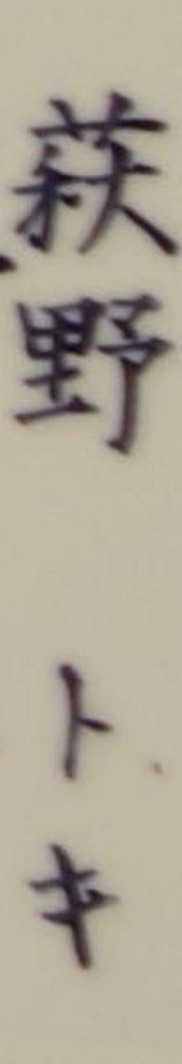萩野トキ
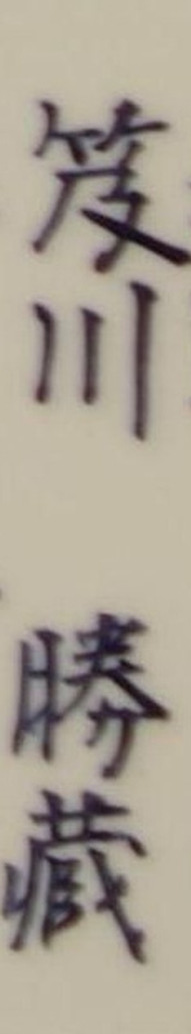笈川勝蔵
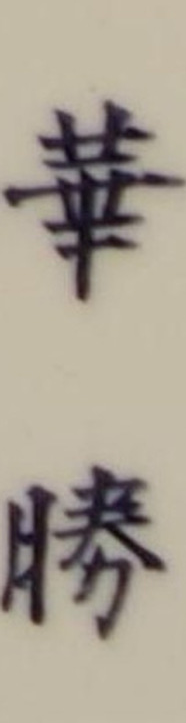汪華勝
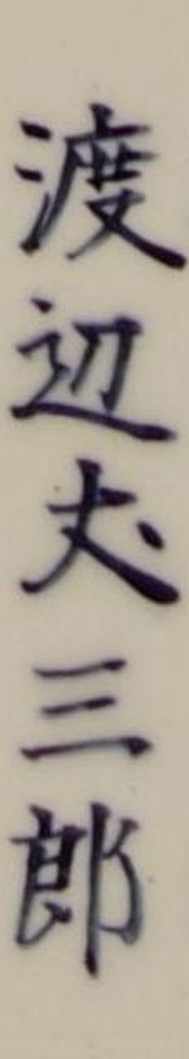渡辺丈三郎
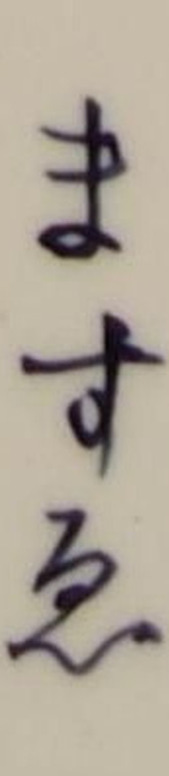ますゑ
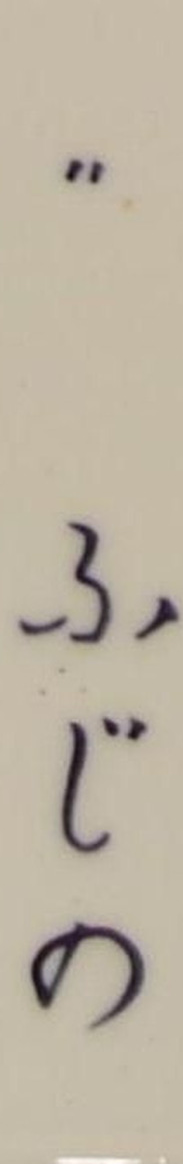ふじの
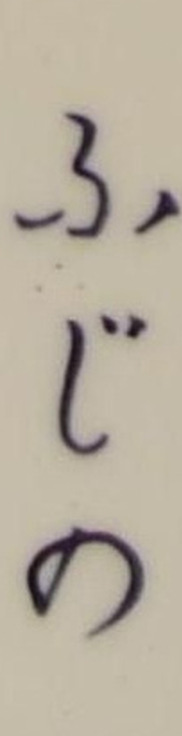ふじの
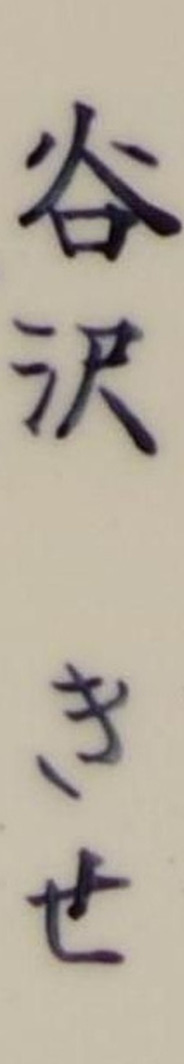谷沢きせ
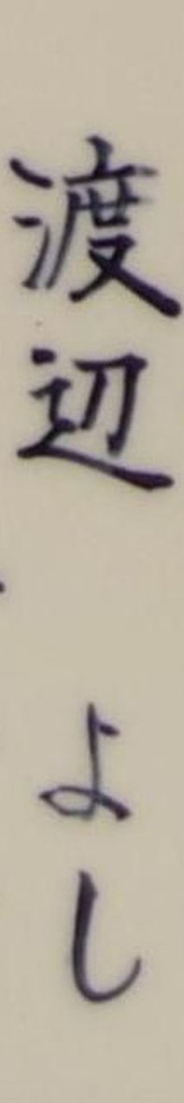渡辺よし
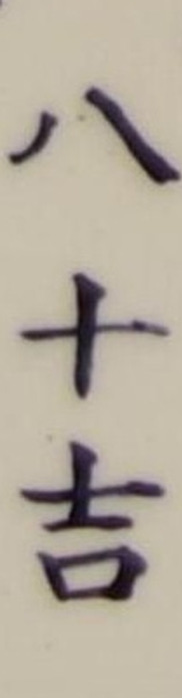八十吉
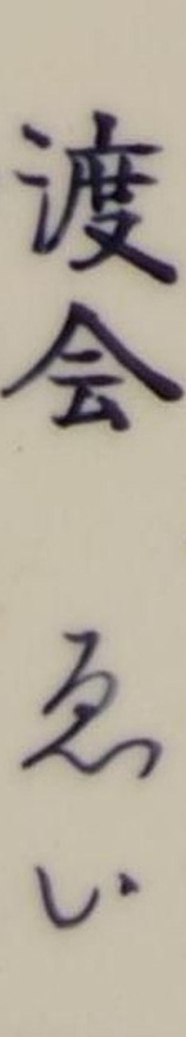渡会ゑい
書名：M~S
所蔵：高野山金剛峯寺
